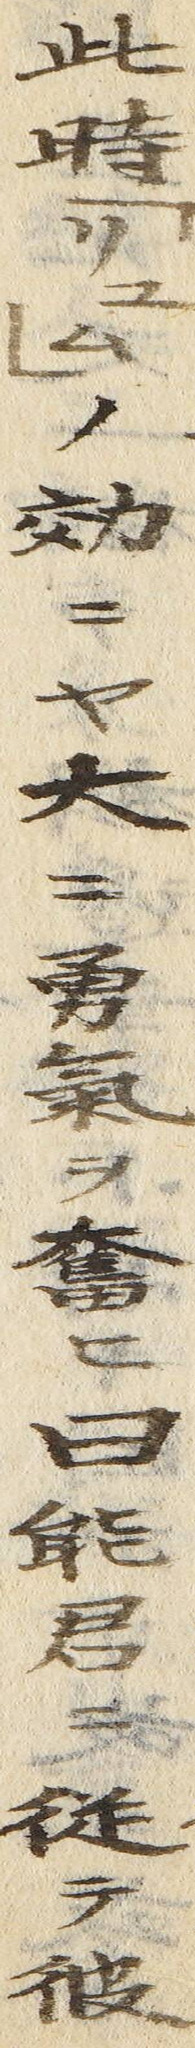此時「リュム」ノ効ニヤ大ニ勇気ヲ奮ヒ曰能君ニ従テ彼
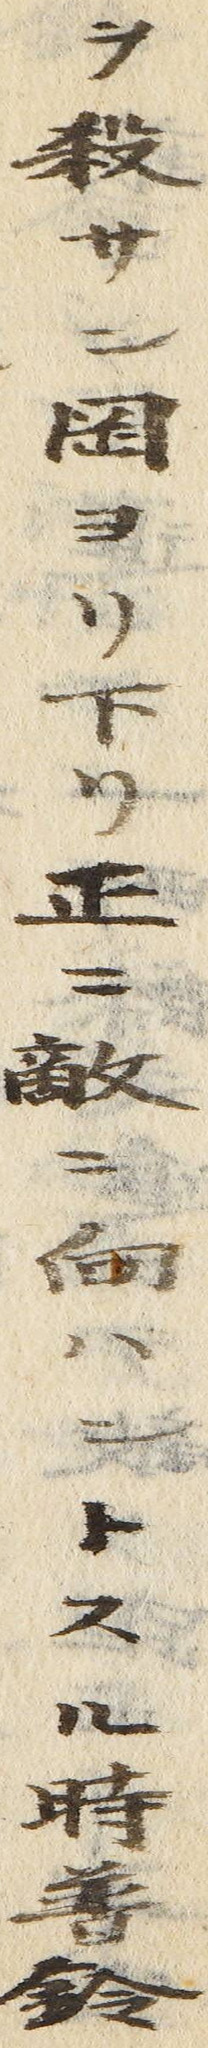ヲ殺サン岡ヨリ下リ正ニ敵ニ向ハントスル時普鈴
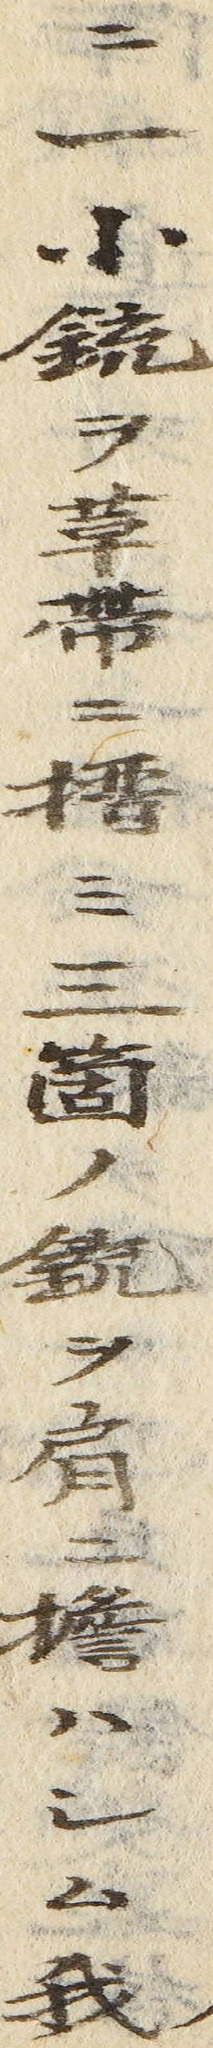ニ一小銃ヲ革帯ニ搢ミ三箇ノ銃ヲ肩ニ担ハシム我
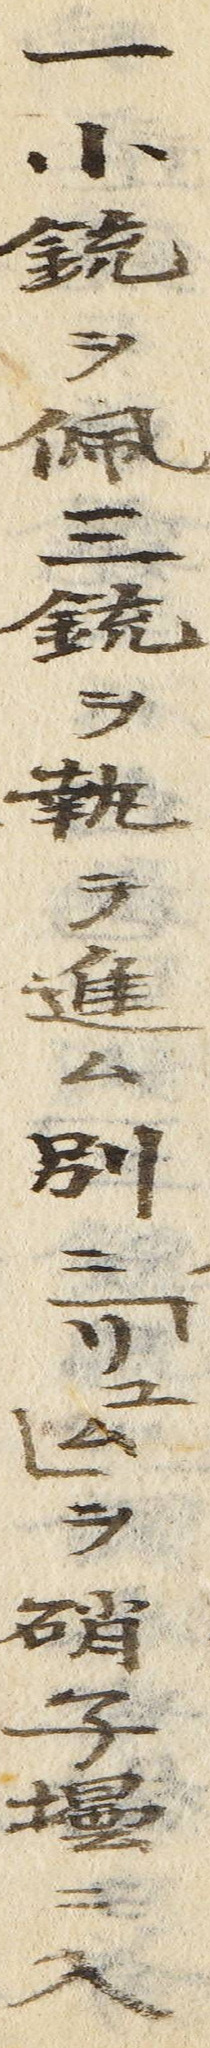一小銃ヲ佩三銃ヲ執テ進ム別ニ「リュム」ヲ硝子壜ニ入
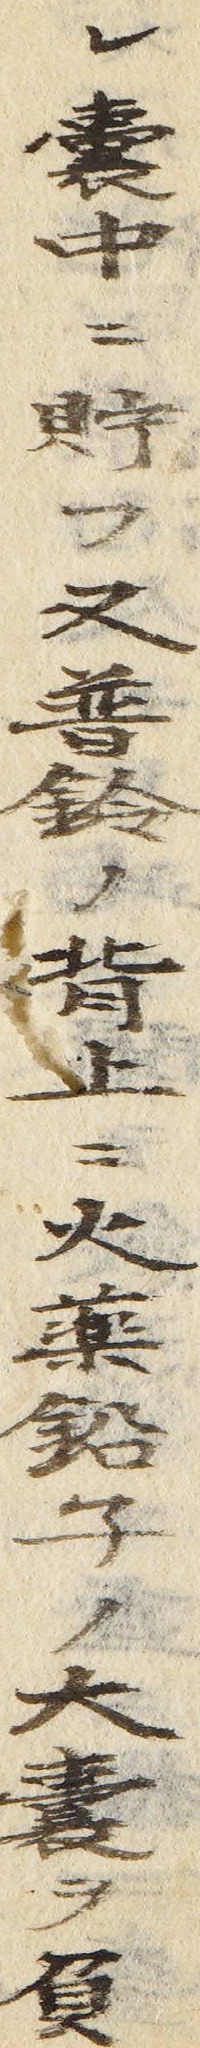レ嚢中ニ貯フ又普鈴ノ背上ニ火薬鉛子ノ大嚢ヲ負
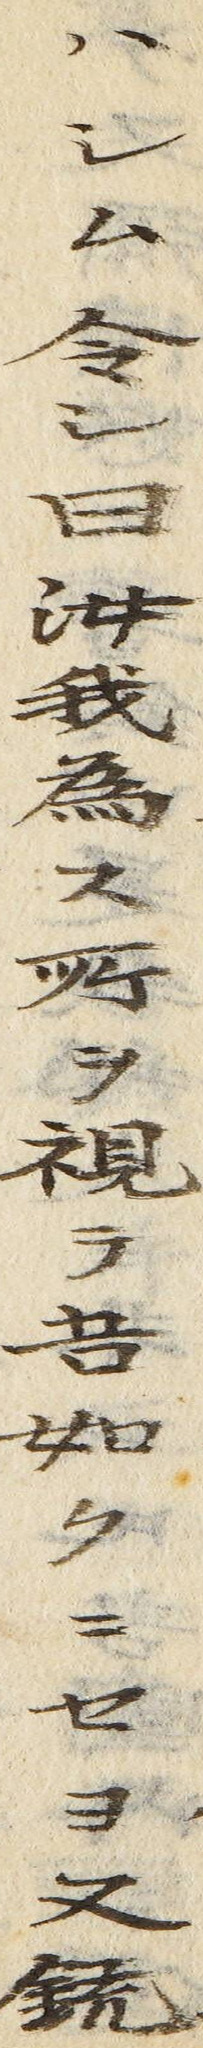ハシム令シ曰汝我為ス所ヲ視テ吾如クニセヨ又銃
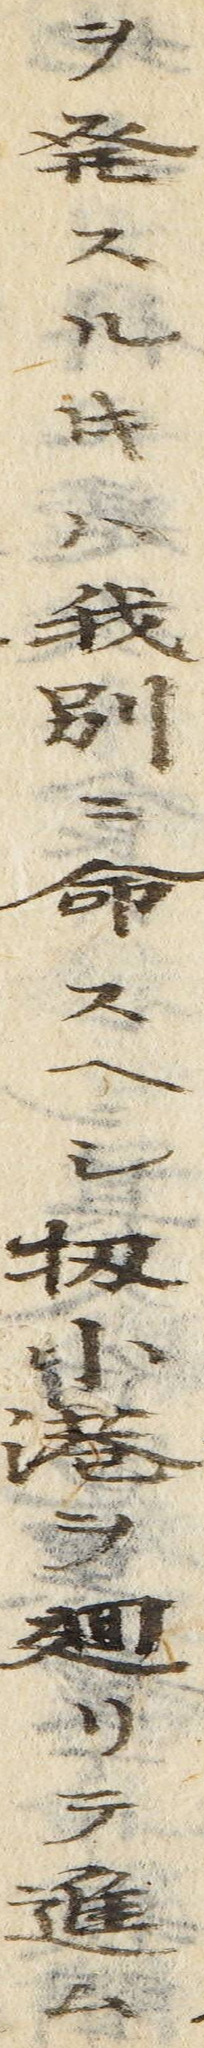ヲ発スルトキハ我別ニ命スヘシ扨小港ヲ廻リテ進ム
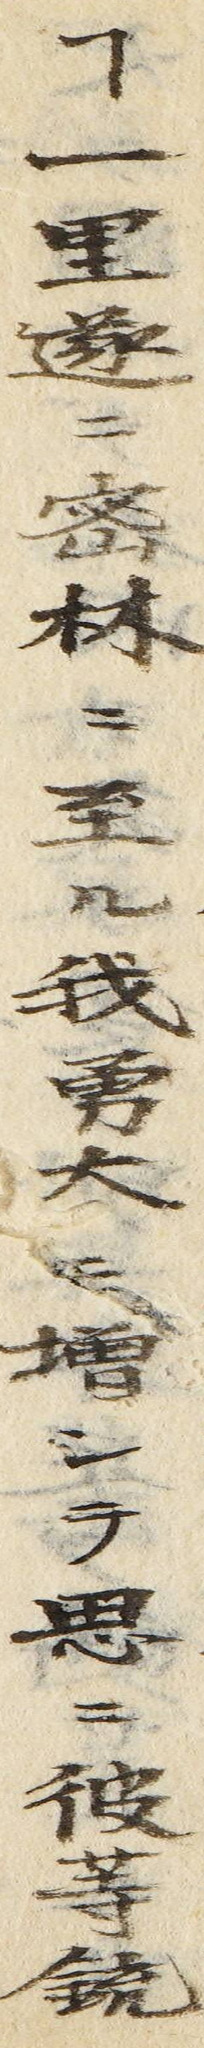コト一里遂ニ密林ニ至ル我勇大モ増シテ思ニ彼等銃
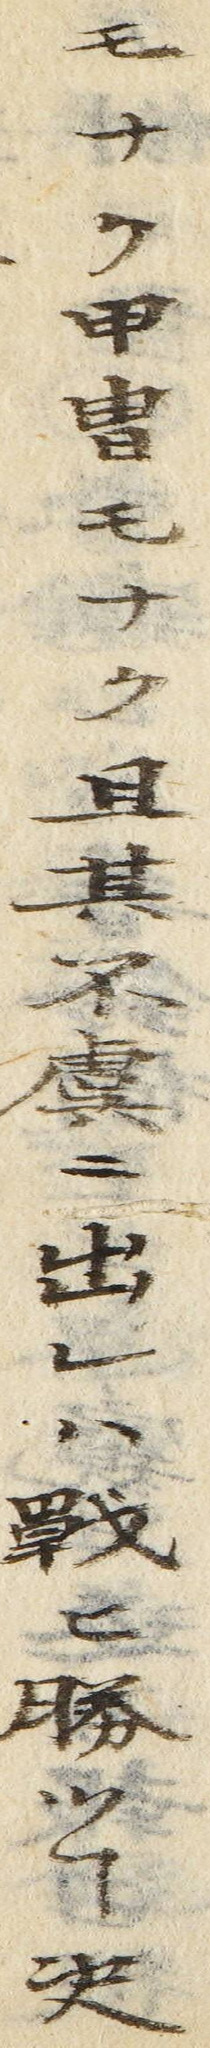モナク甲冑モナク且其不虞ニ出レハ戦ヒ勝ツコト決
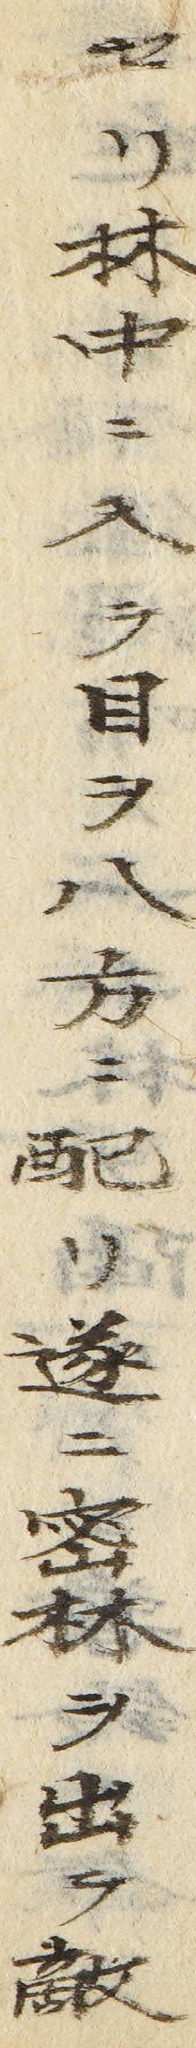セリ林中ニ入テ目ヲ八方ニ配リ遂ニ密林ヲ出テ敵

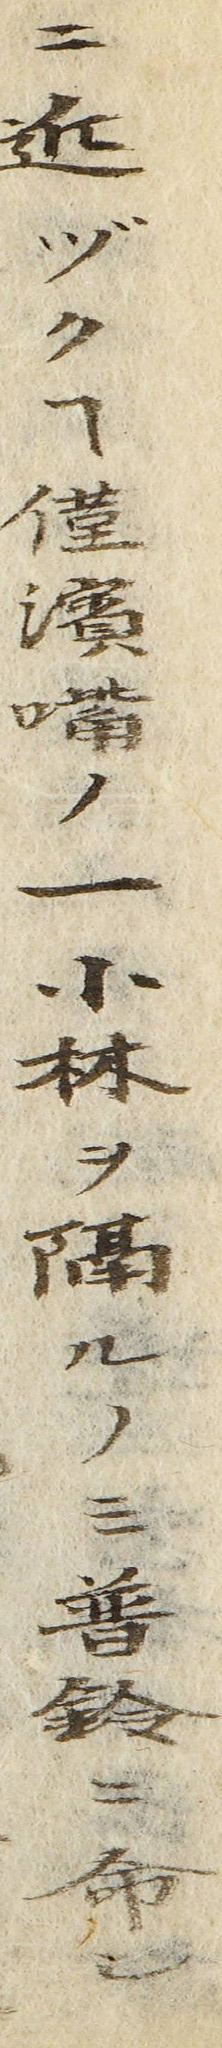ニ近ヅクコト僅浜嘴ノ一小林ヲ隔ルノミ普鈴ニ命シ
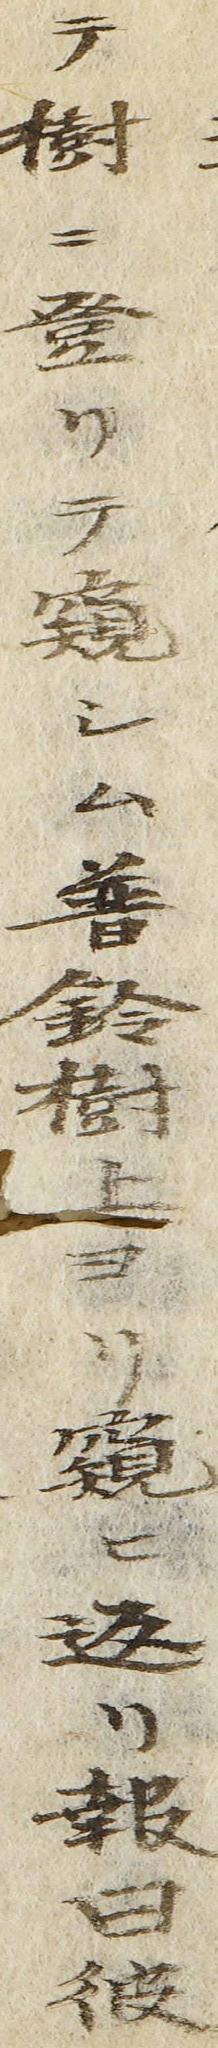テ樹ニ登リテ窺シム普鈴樹上ヨリ窺ヒ返リ報曰彼
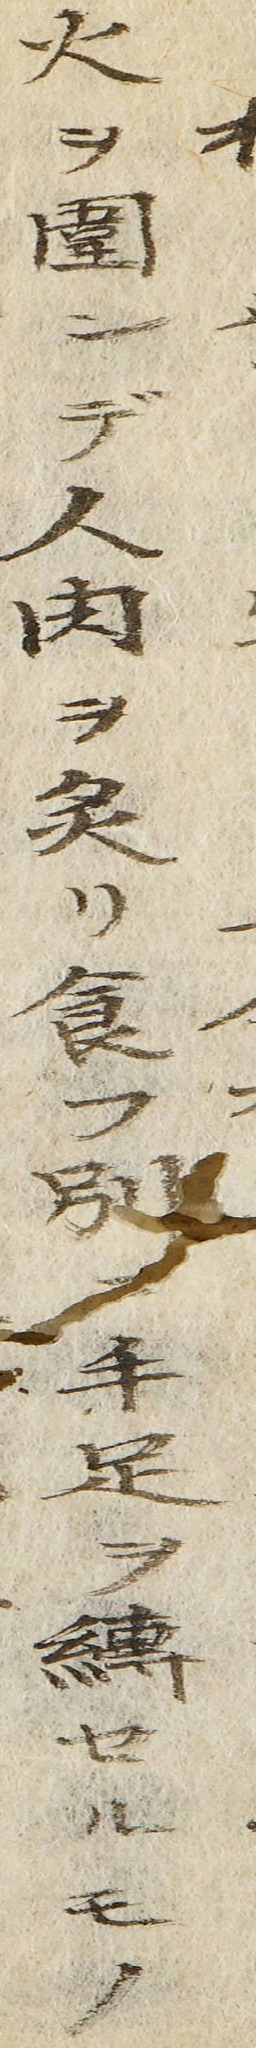火ヲ囲ンデ人肉ヲ炙り食フ別ニ手足ヲ縛セルモノ
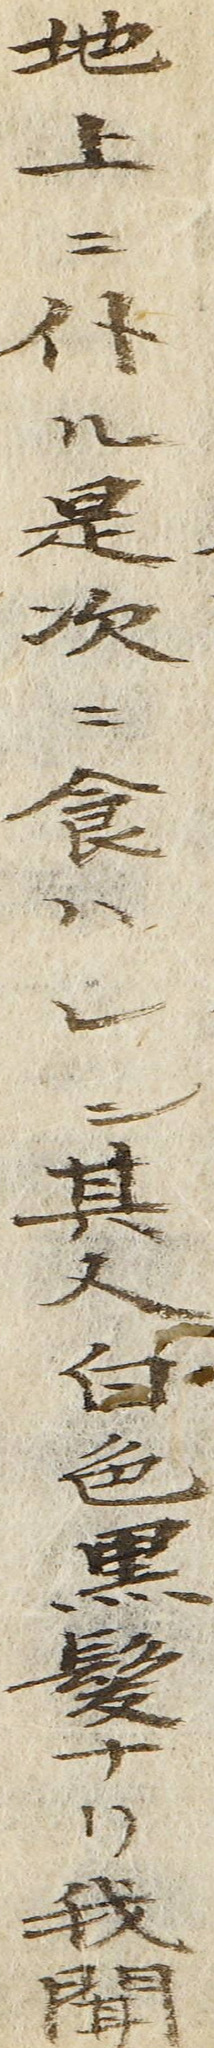地上ニ仆ル是次ニ食ハレン其人白色黒髪ナリ我聞
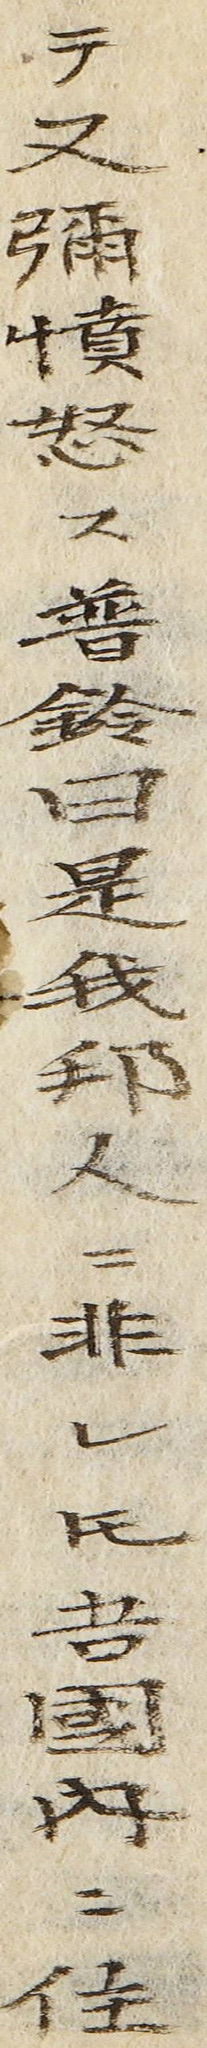テ又弥憤怒ス普鈴曰是我邦人ニ非レトモ吾国内ニ住
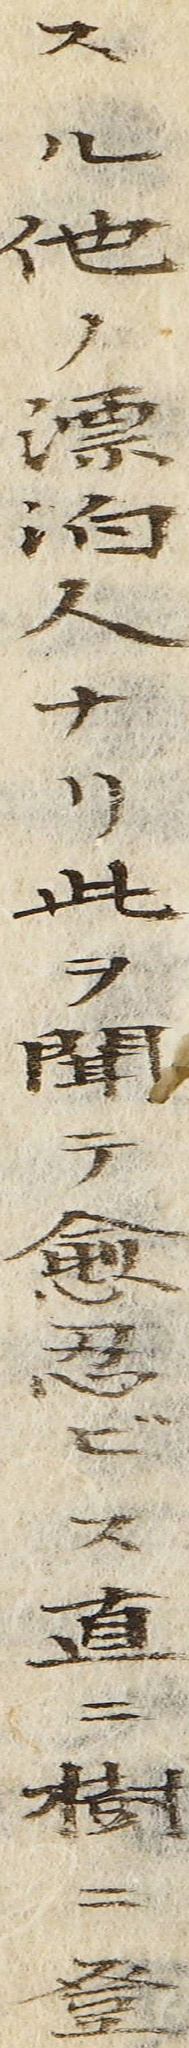スル他ノ漂泊人ナリ此ヲ聞テ愈忍ビス直ニ樹ニ登
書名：漂流紀事
